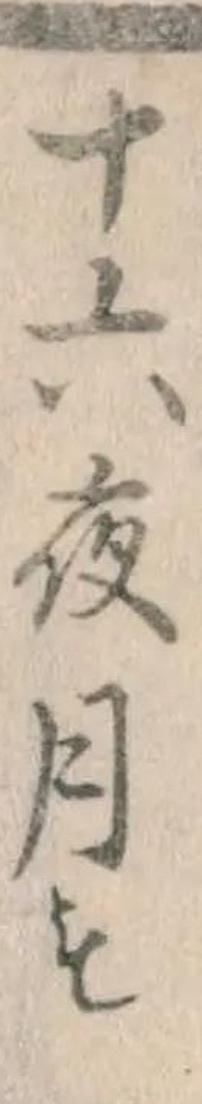十六夜月も
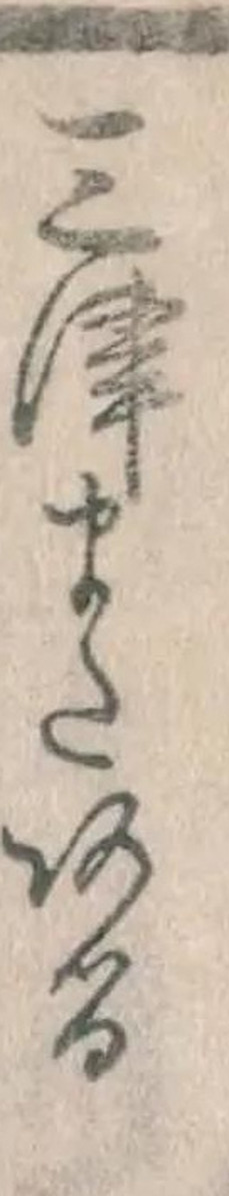みつまたある
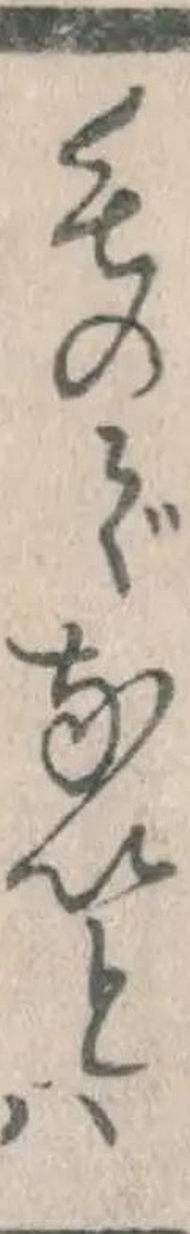ものでないとは
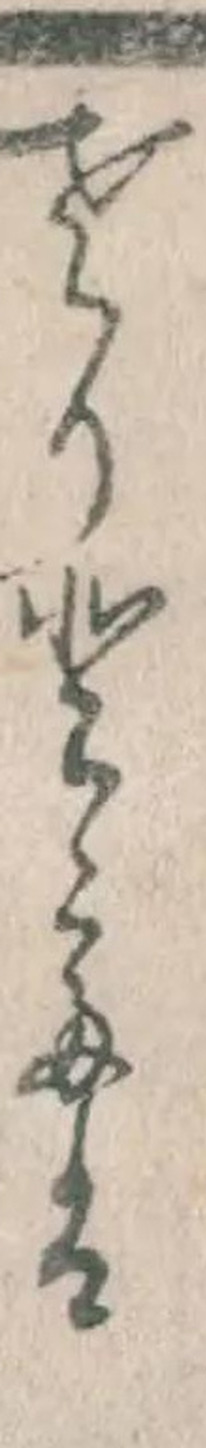さりとては
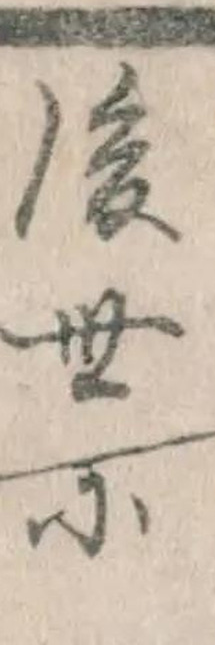後世に
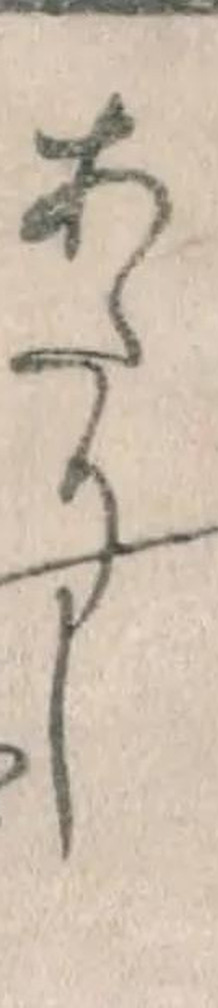あたりし

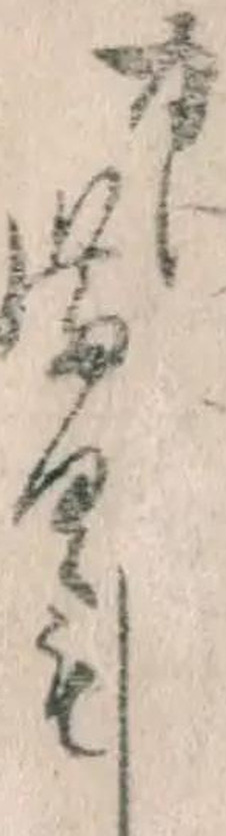まくも
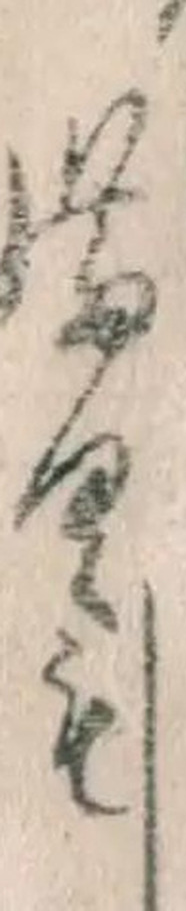まくも
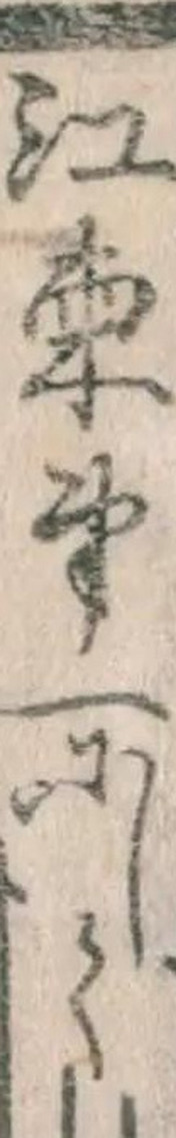江東第一にして
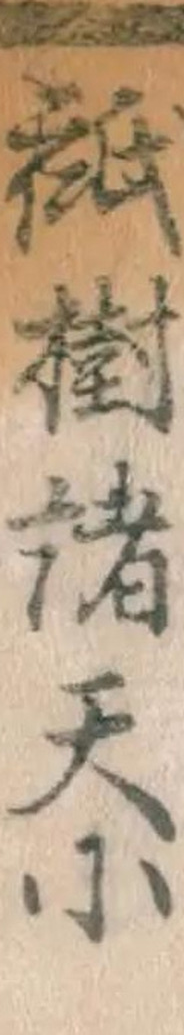祇樹諸天に
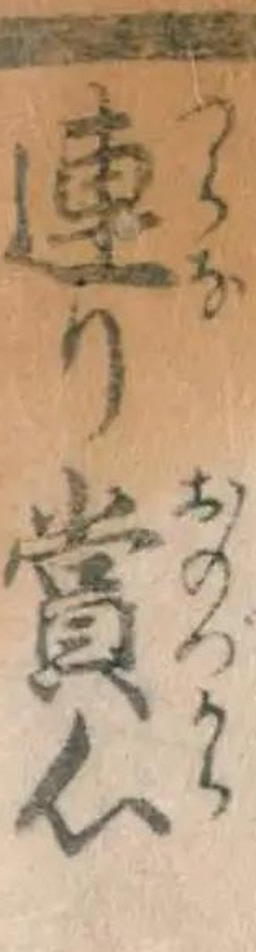連り賞心
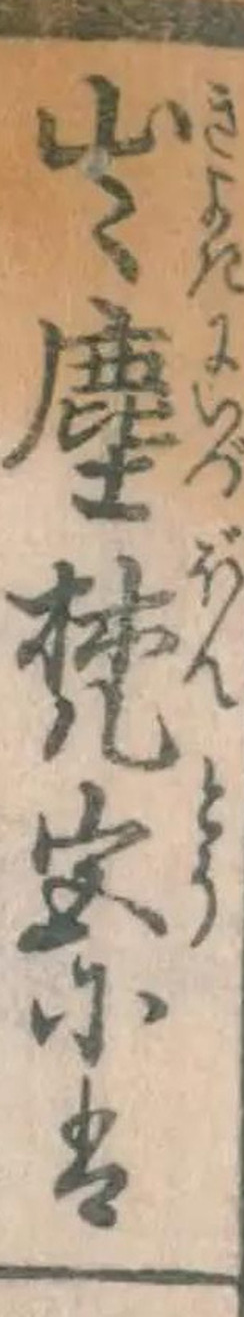出塵梵宮には
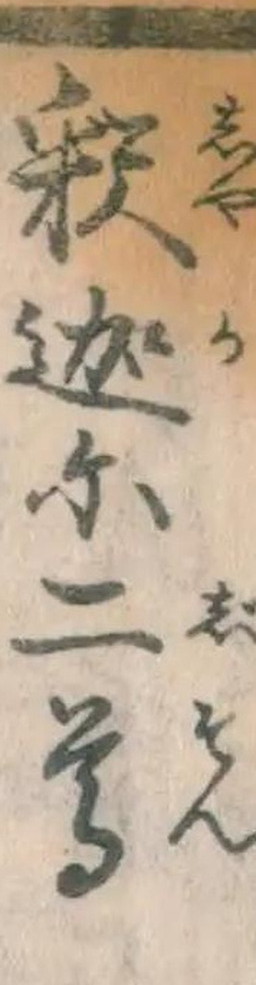釈迦に二尊
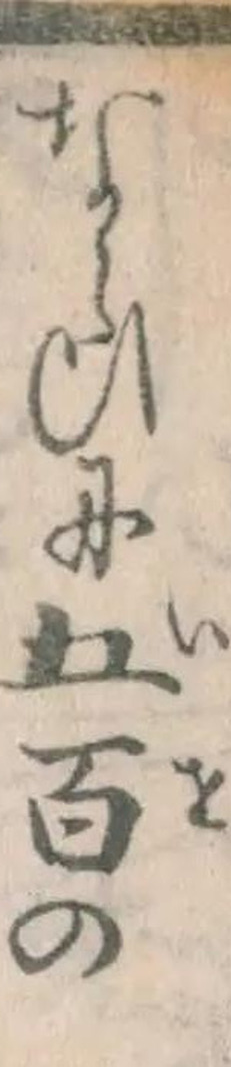ならひに五百の
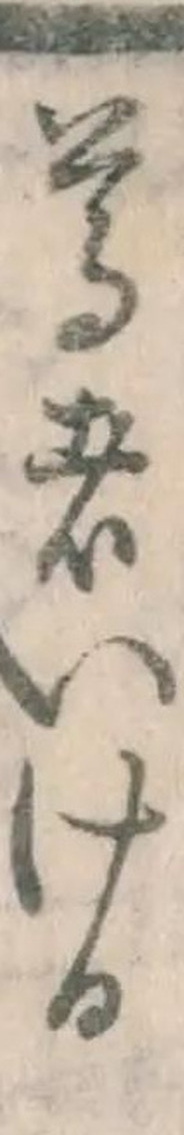尊者いける
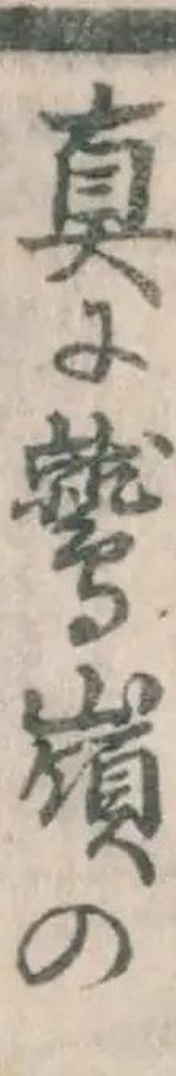真に鷲嶺の
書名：絵本物見岡
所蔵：国立国会図書館 National Diet Library, JAPAN
